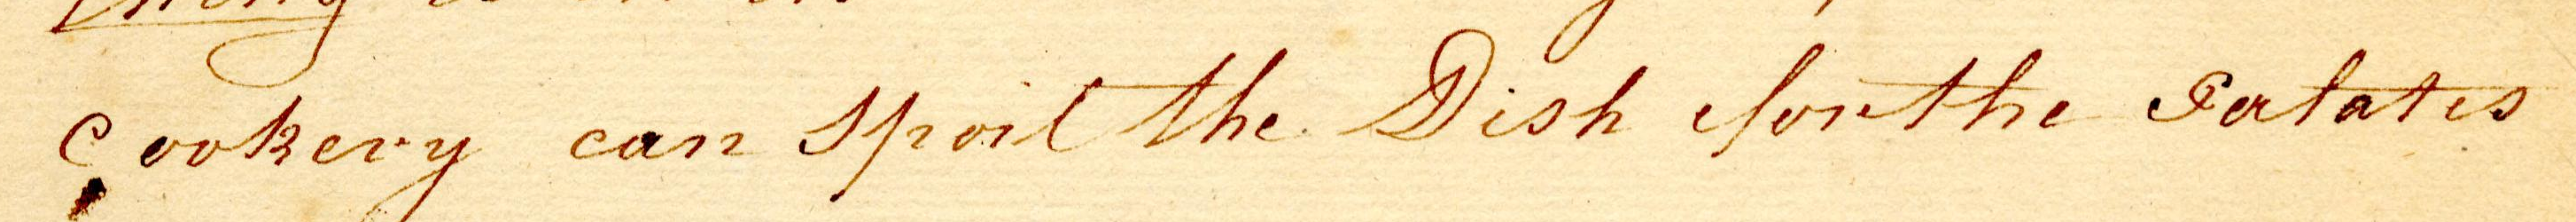cookery can spoil the Dish for the Palates
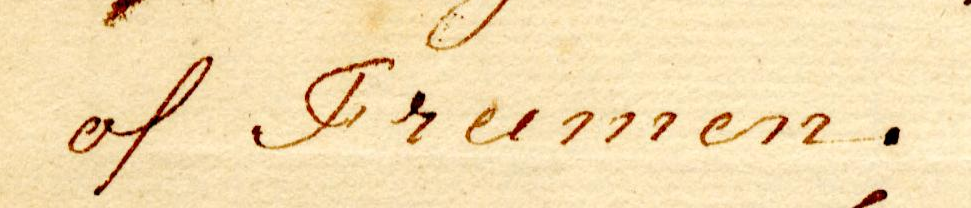of Freemen.
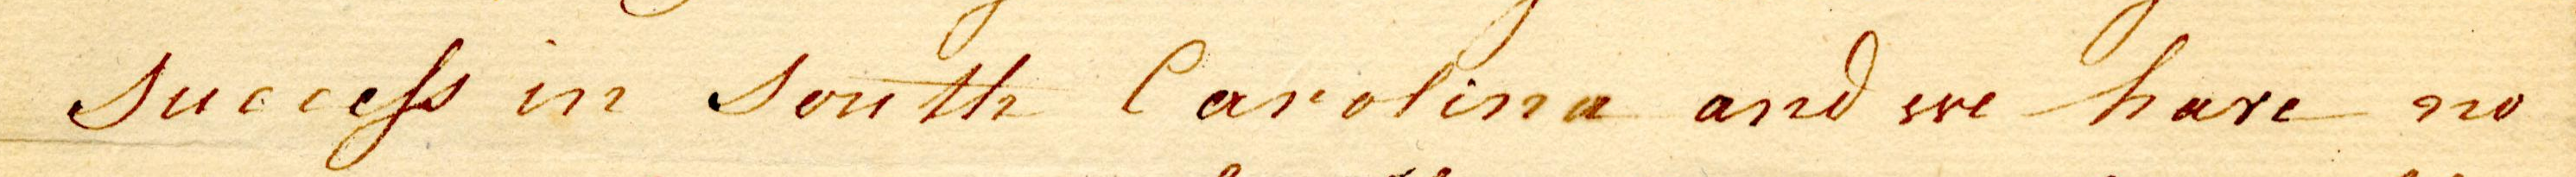success in South Carolina and we have no
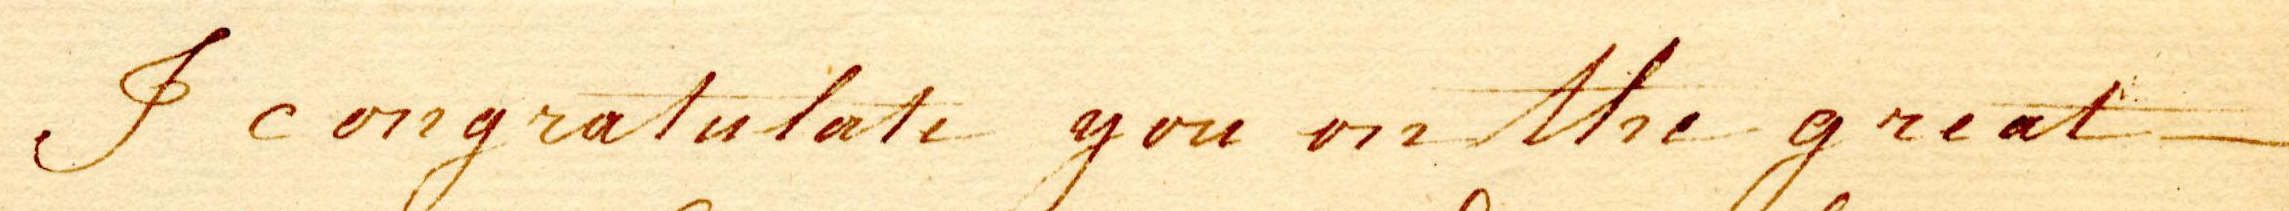I congratulate you on the great-
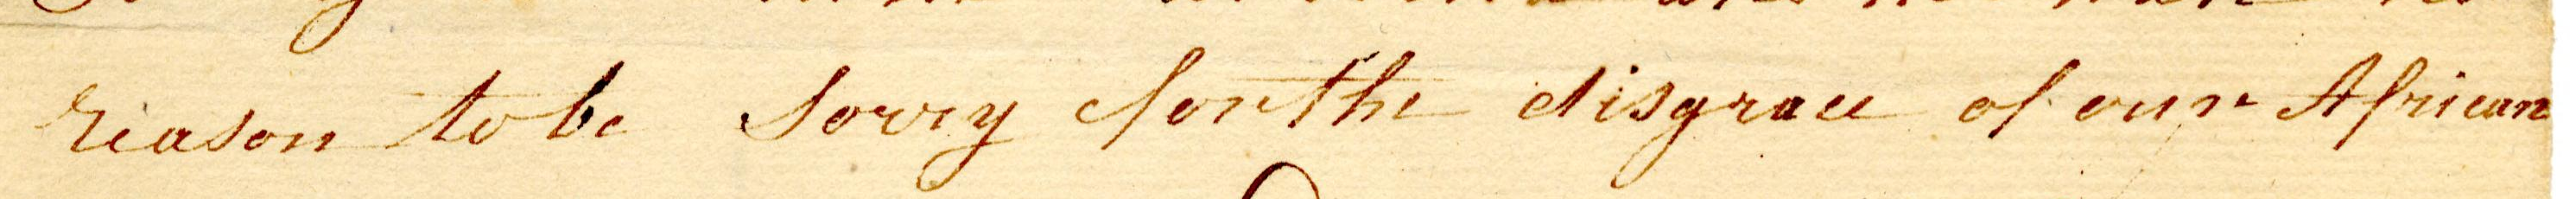reason to be sorry for the disgrace of our African
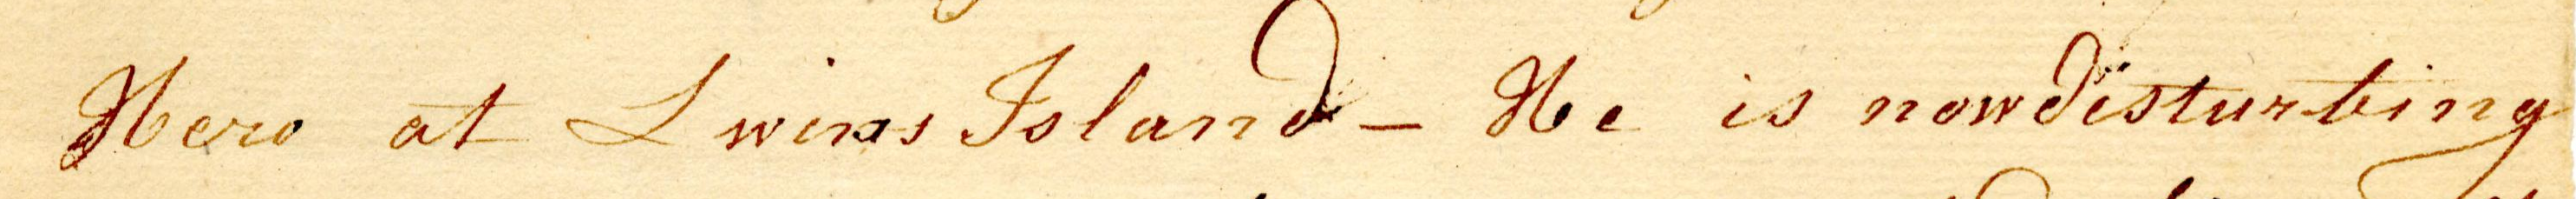Hero at Qwins Island- He is now disturbing
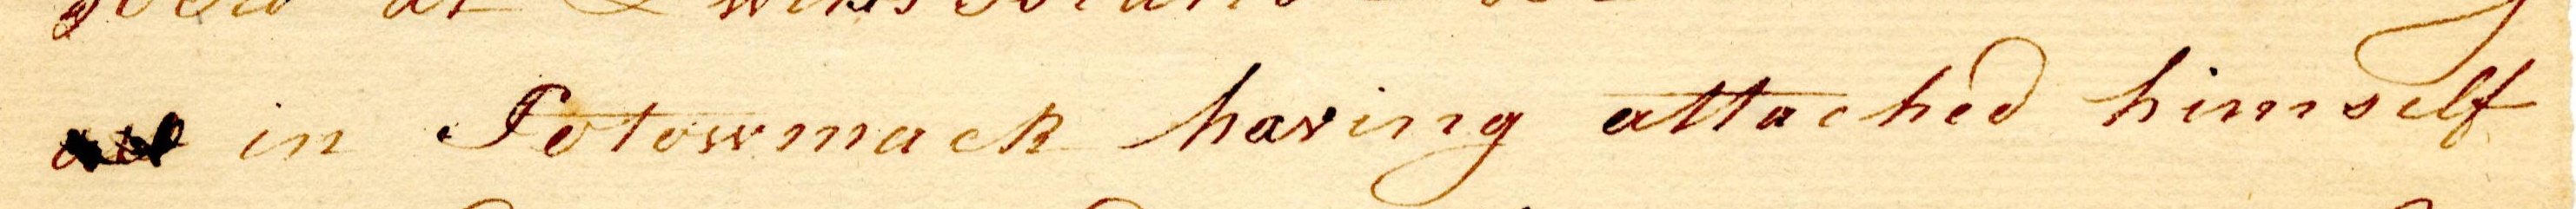in Potowmack having attached himself
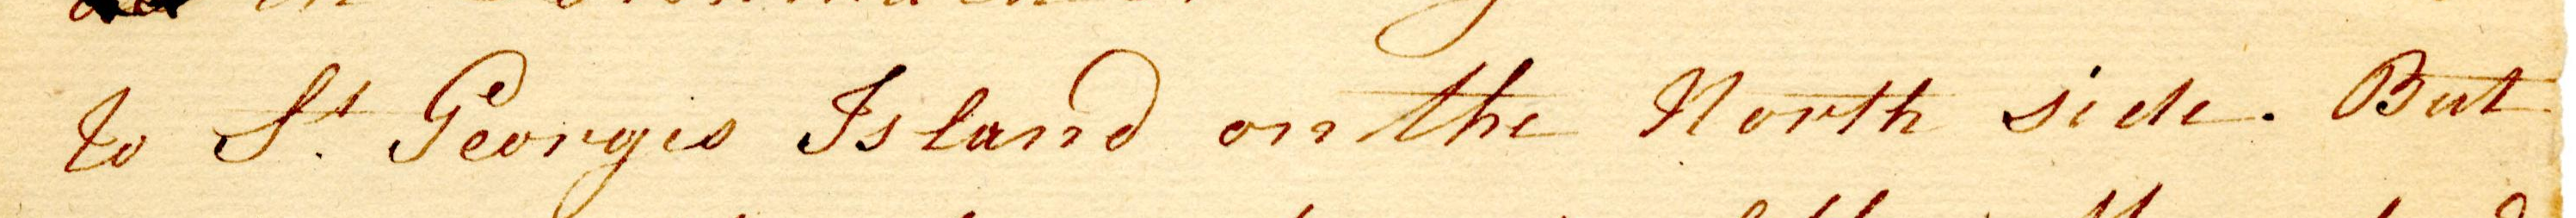to S^t. Georges Island on the North side. But
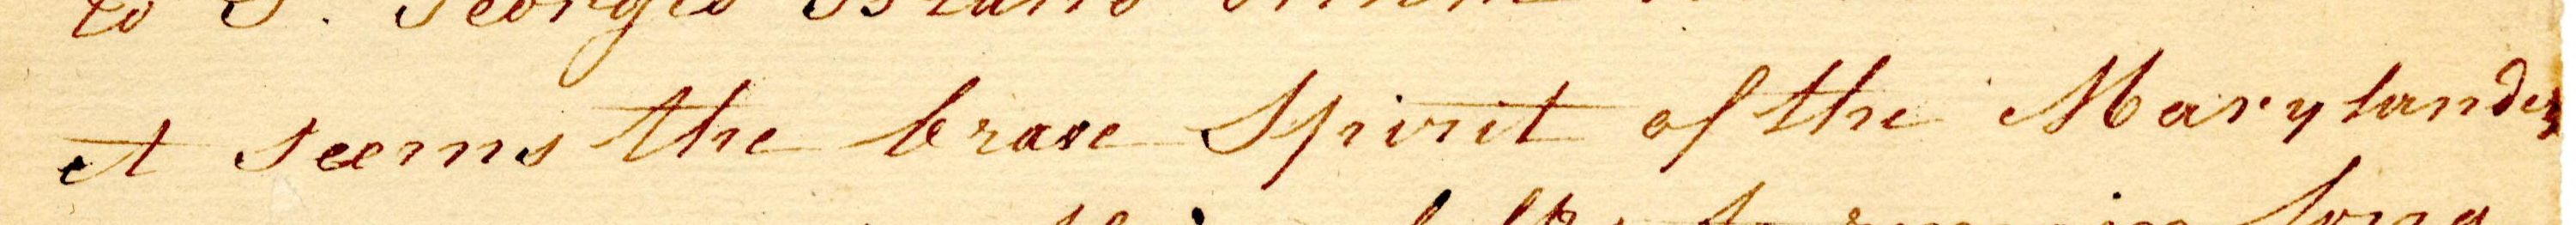it seems the brave spirit of the Marylanders
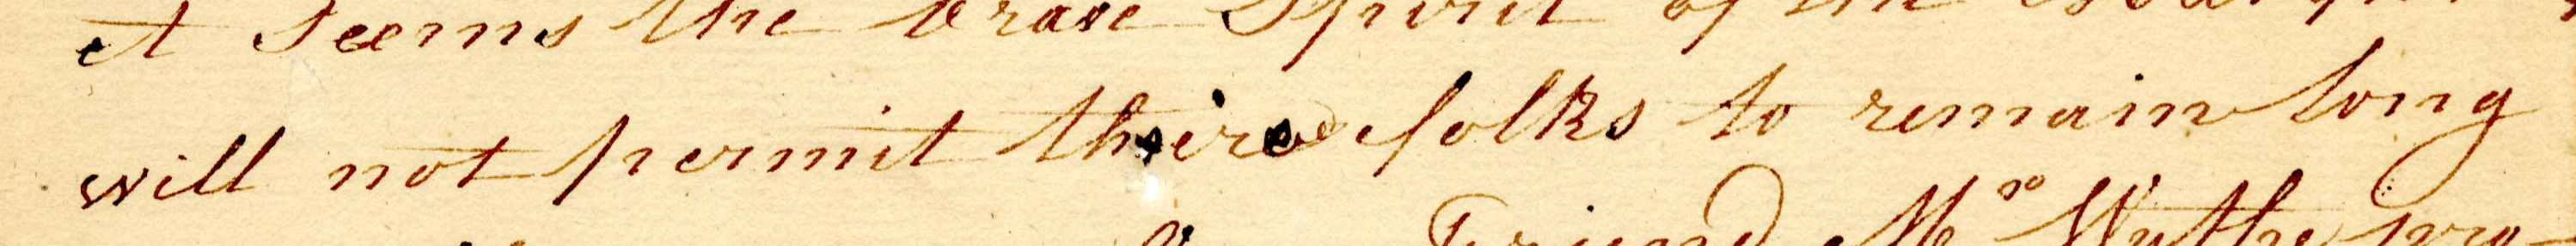will not permit their folks to remain lving
